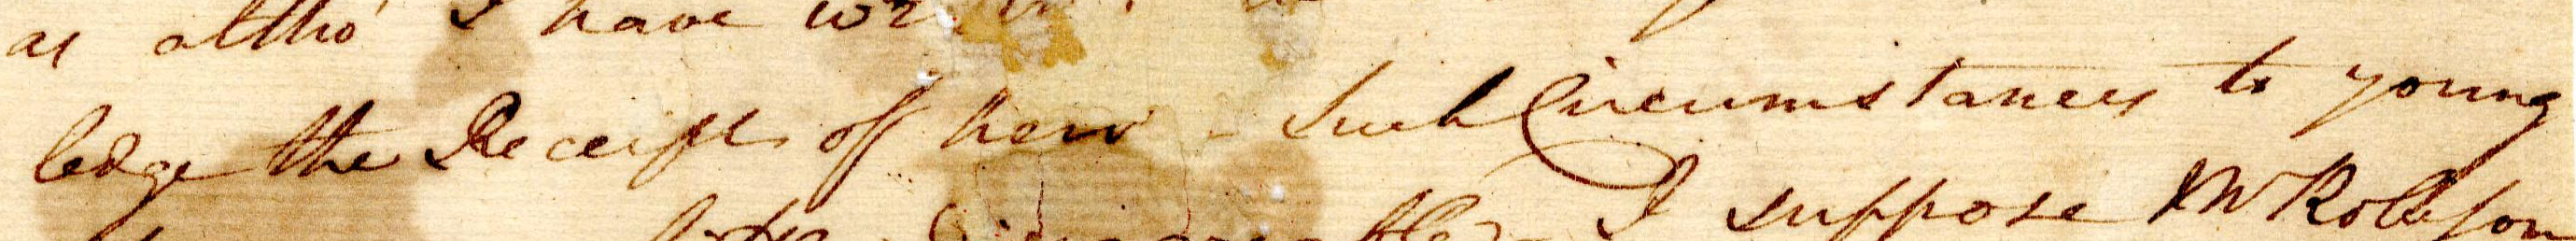ledge the Receipt of how Such Circumstances to young
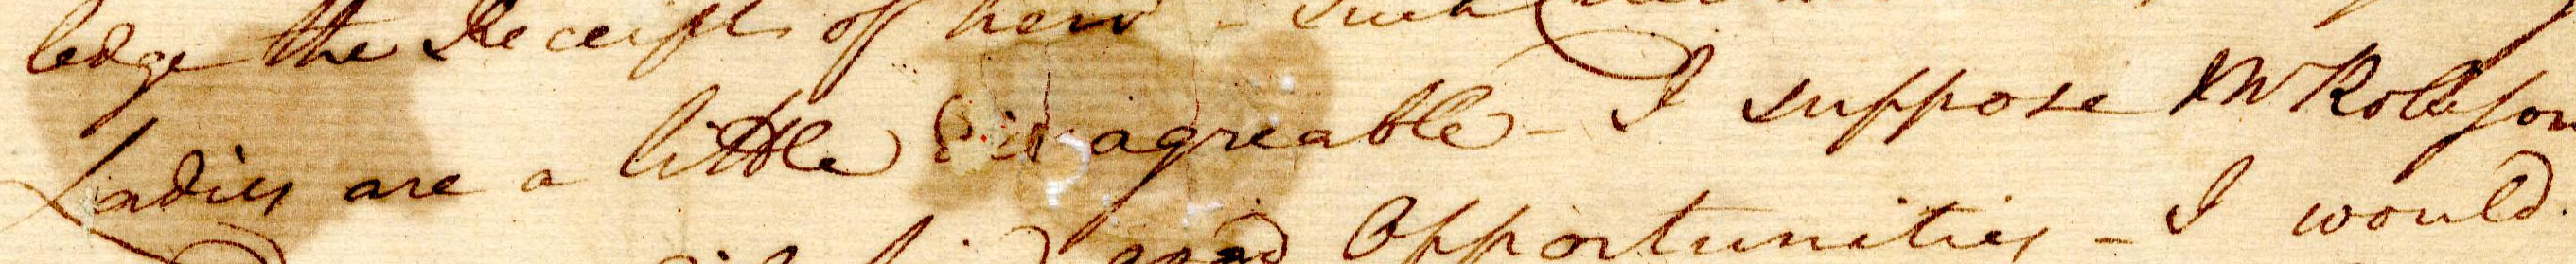Ladies are a little disagreable. I suppose M^r Robson
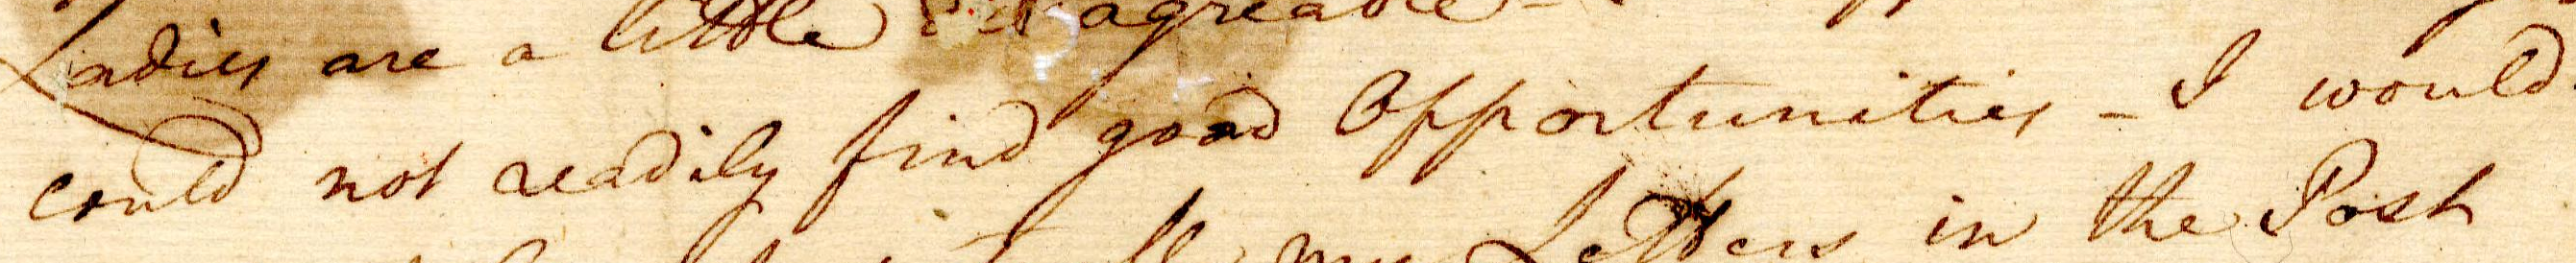could not readily find good Opportunities- I would
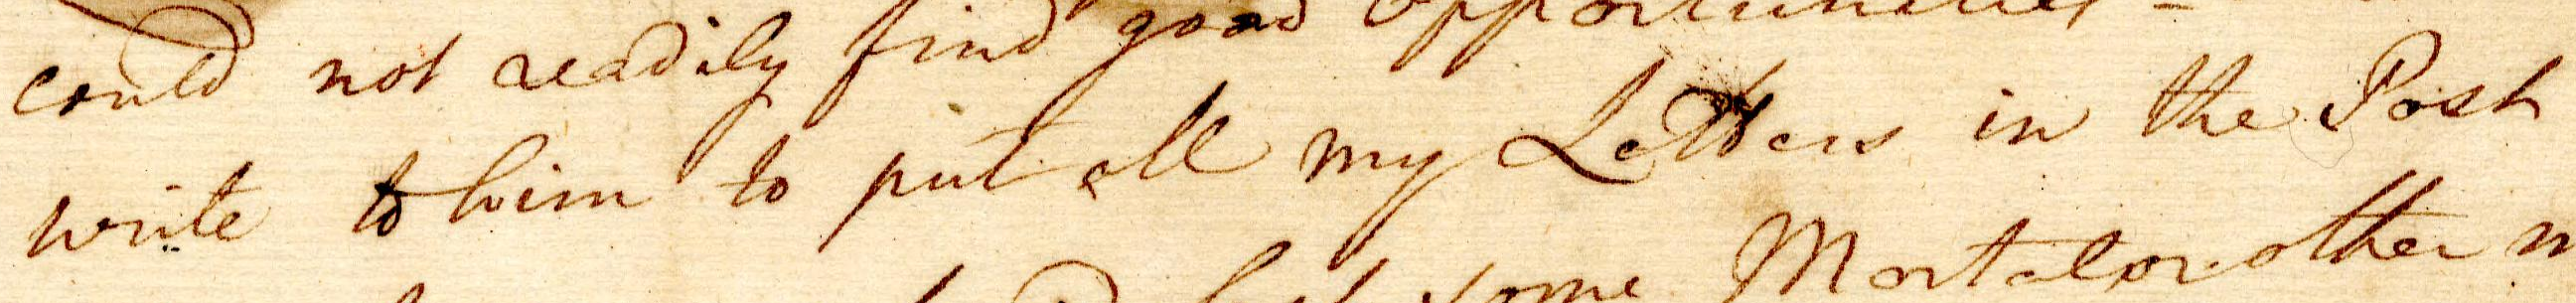write to him to put all my Letters in the Post
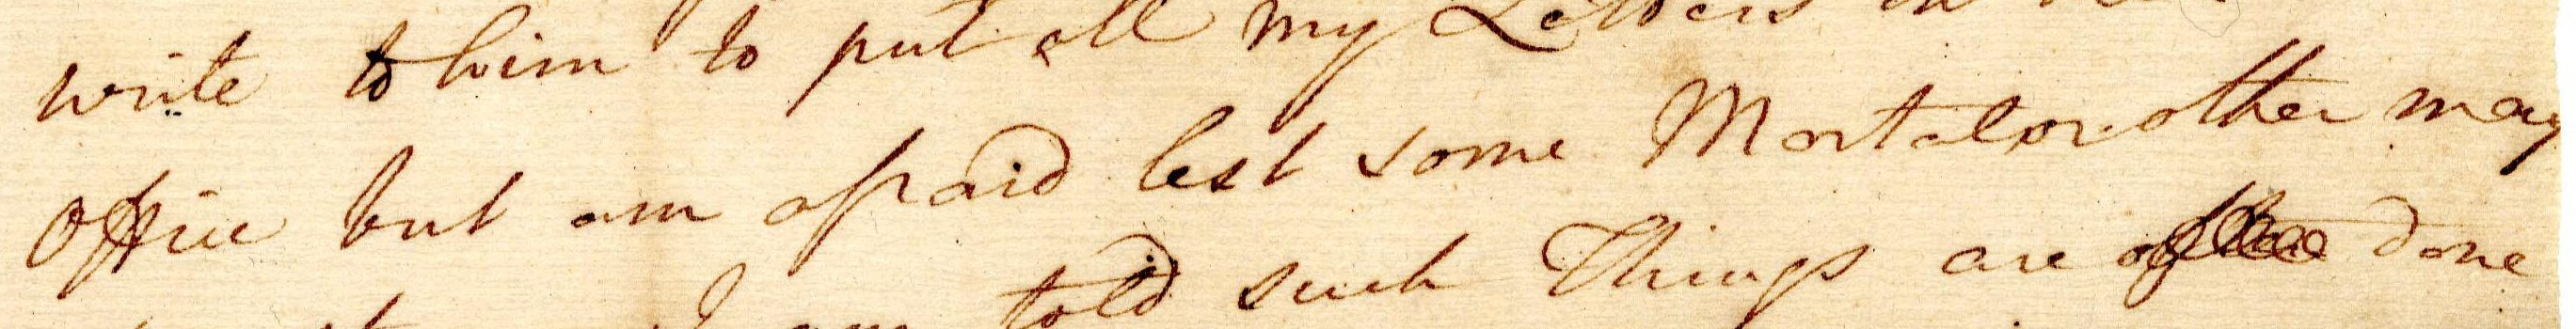Office but am afraid lest some Mortal or other may
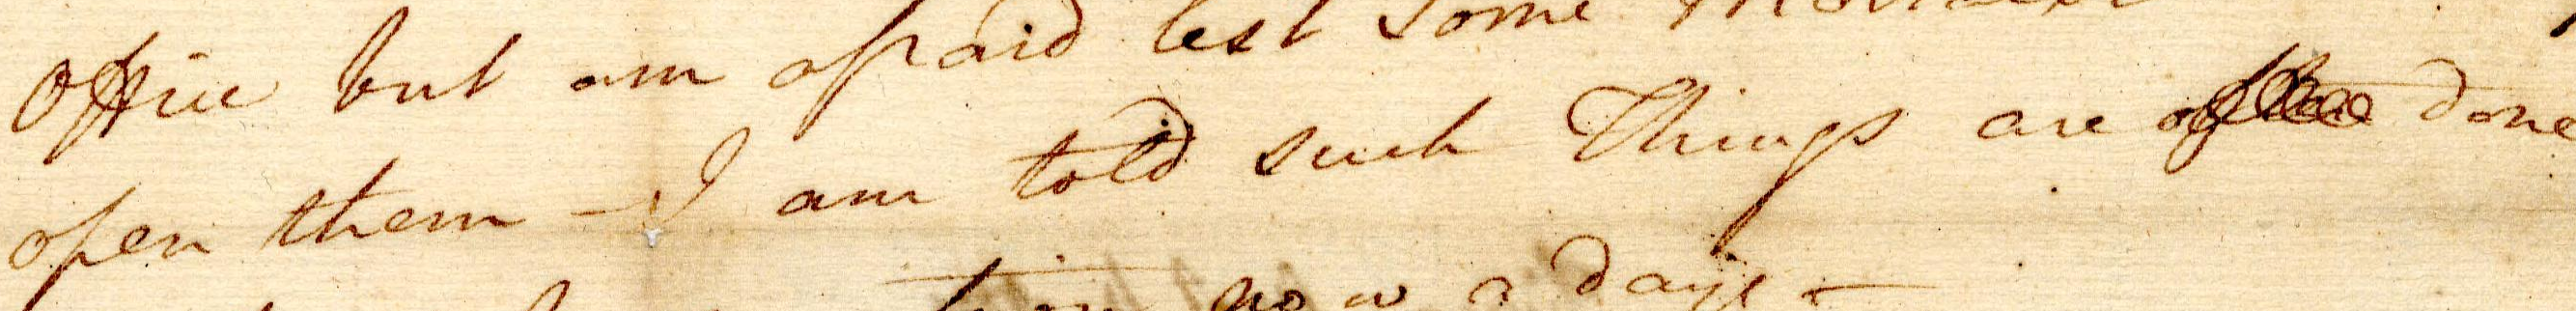open them- I am told such Things are of [___] done
